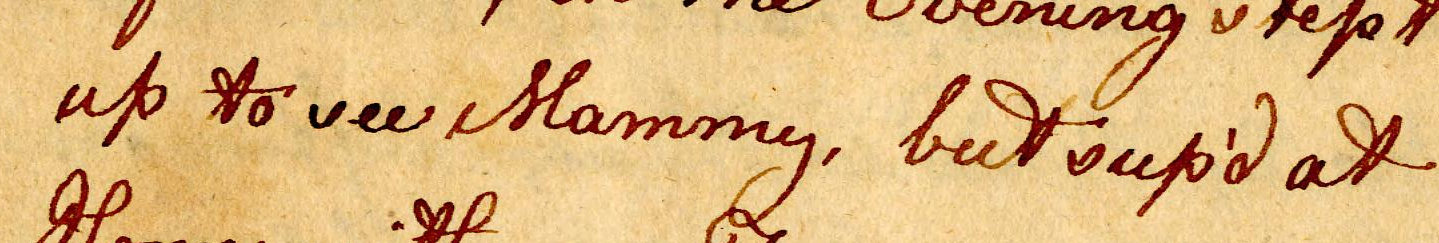up to see Mammy, but sup'd at
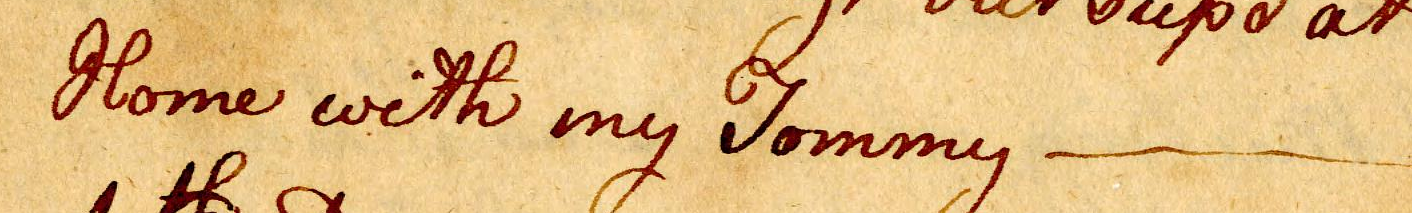Home with my Tommy-
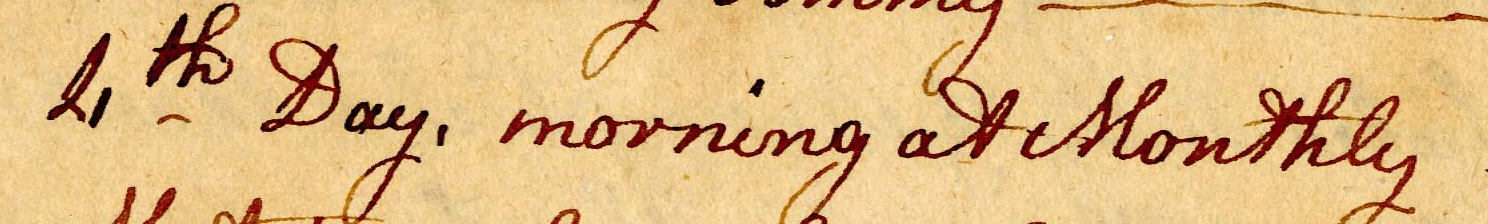4^th Day, morning at Monthly
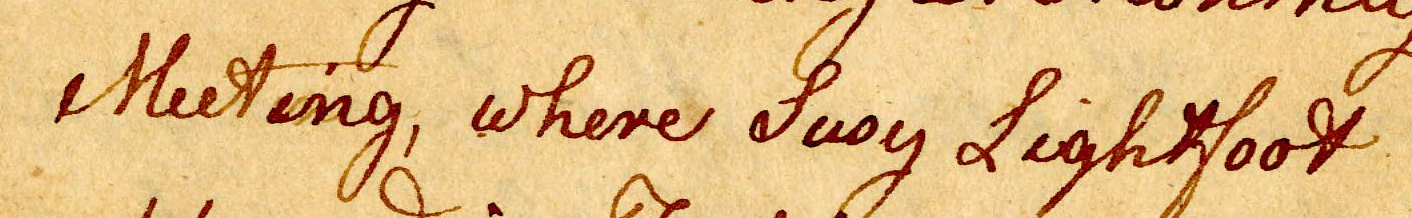Meeting, where Susy Lightfoot
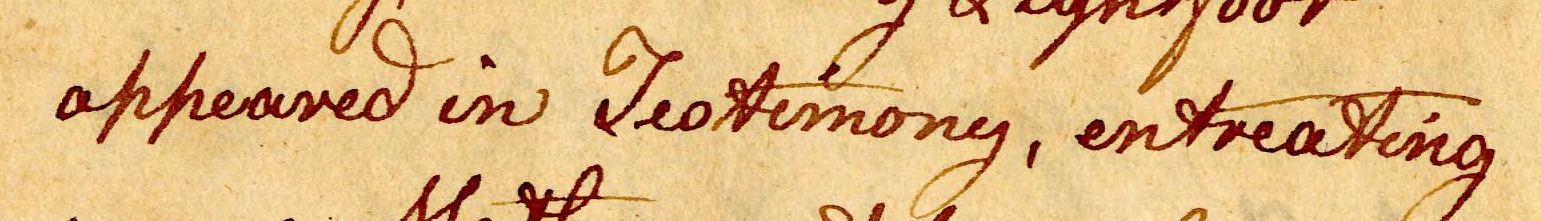appeared in Testimony, entreating
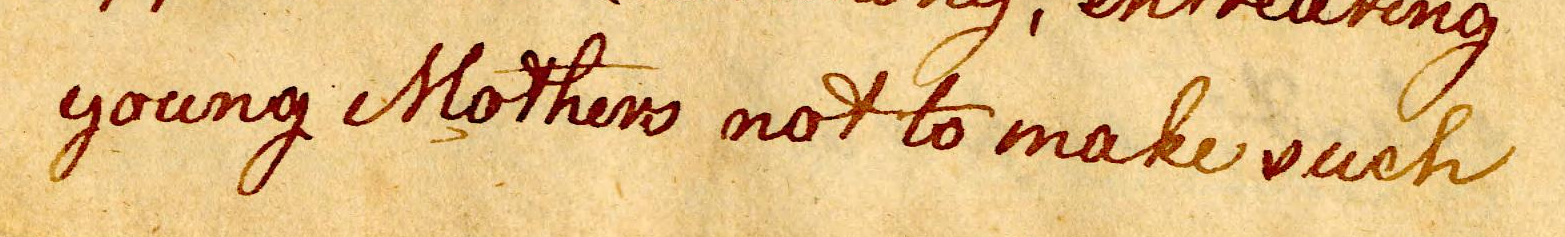young Mothers not to make such
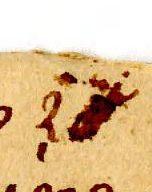28
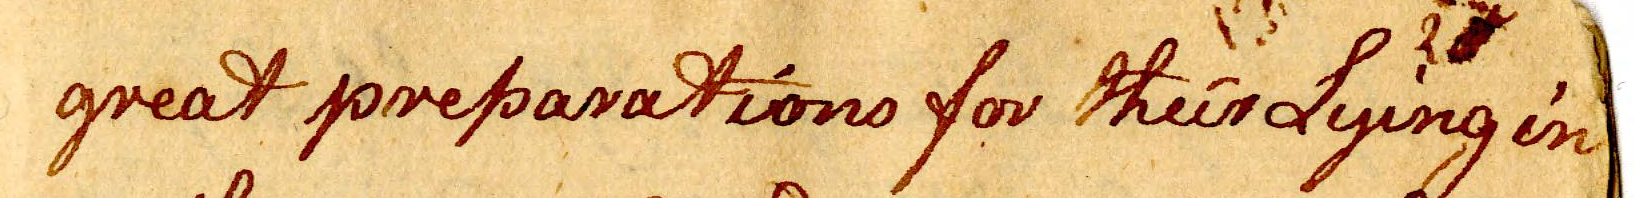great preparations for their Lying in
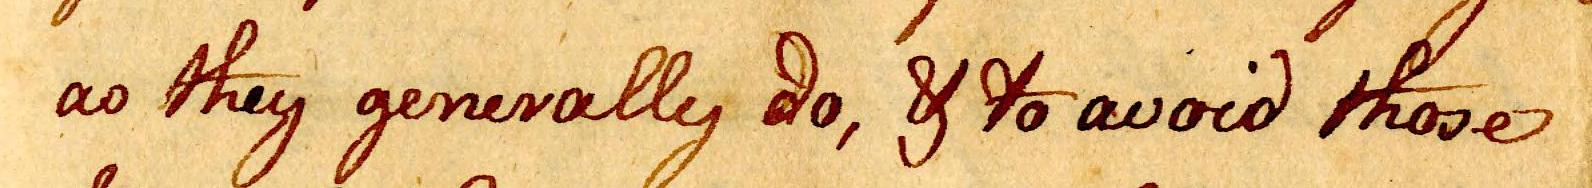as they generally do, & to avoid those
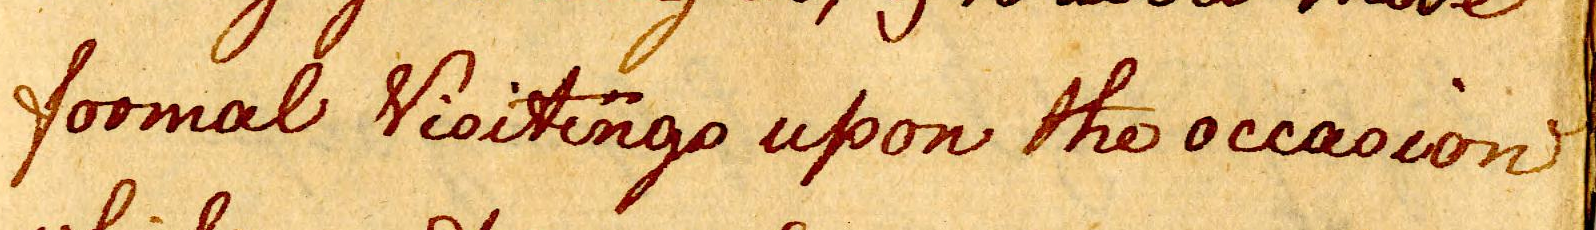formal Visitings upon the occasion
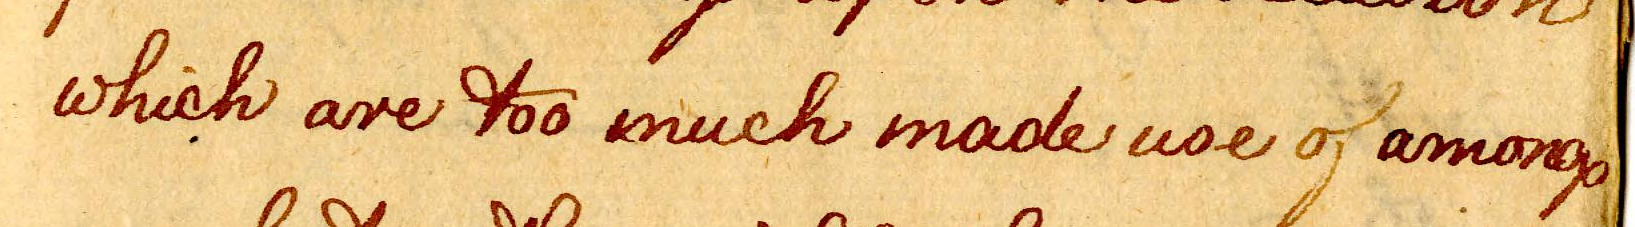which are too much made use of among
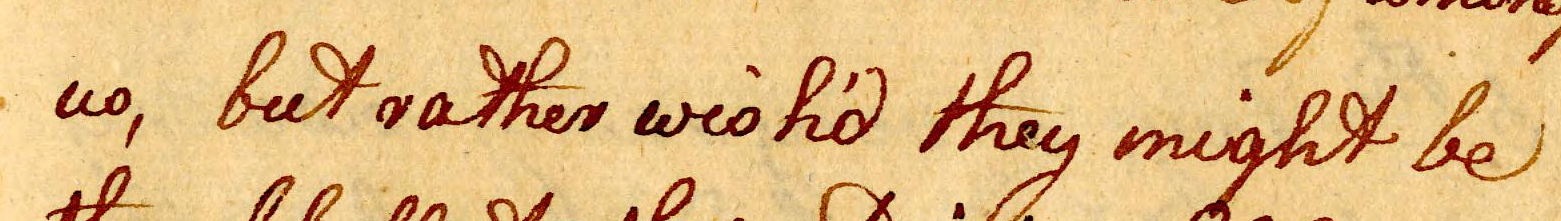us, but rather wish'd they might be
